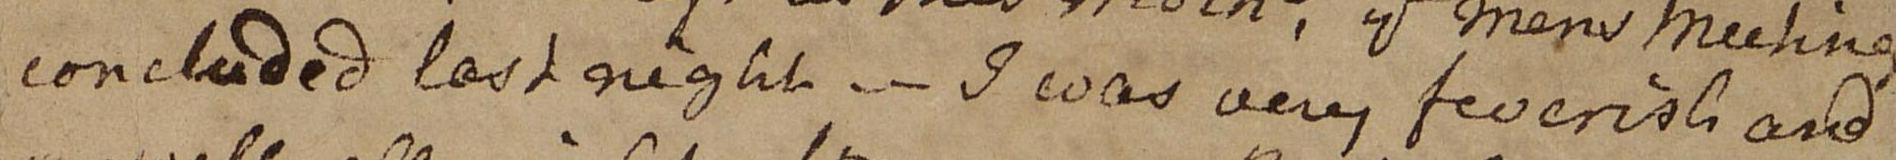concluded last night- I was very feverish and
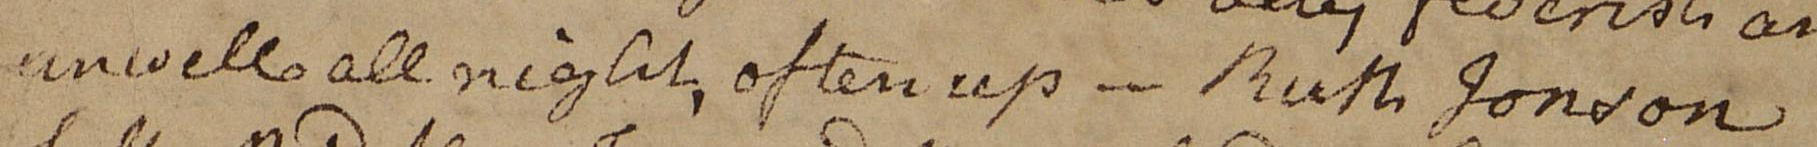unwell all night, often up- Ruth Jonson
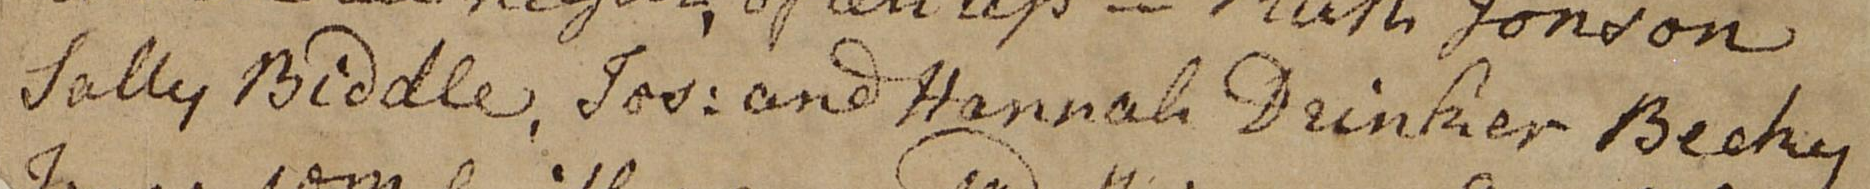Sally Biddle, Jos: and Hannah Drinker Becky
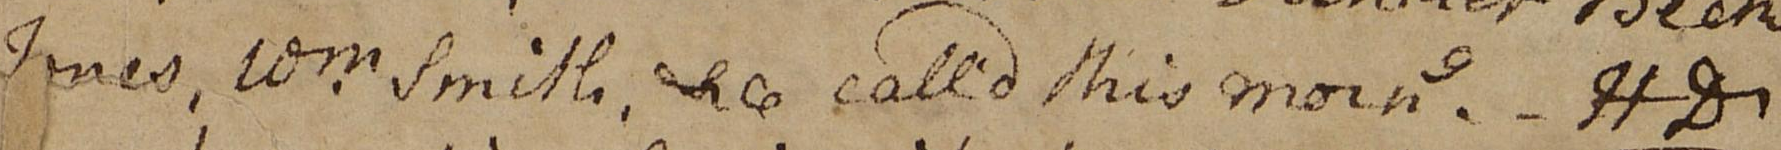[Jon]es, W^m. Smith &c call'd this morn^g.- HD
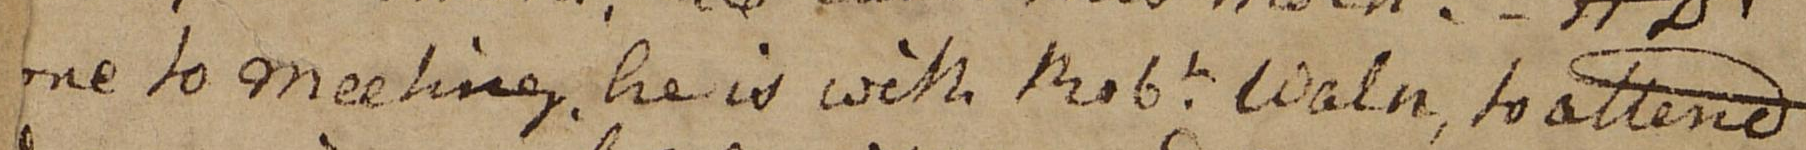me to meeting, he is with Rob^t. Waln, to attend
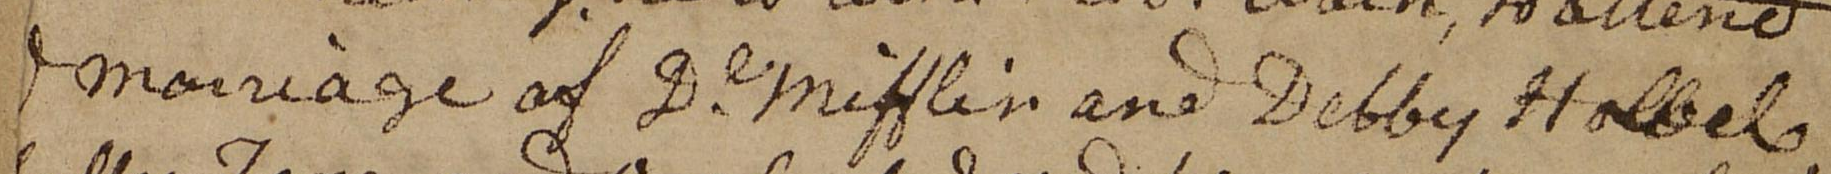I marriage of D^l. Mifflin and Debby Howel,
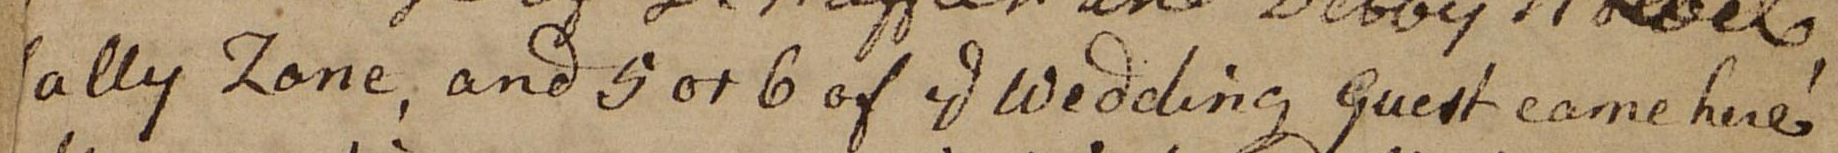Sally Zane, and 5 or 6 of y^e Wedding Guest came here
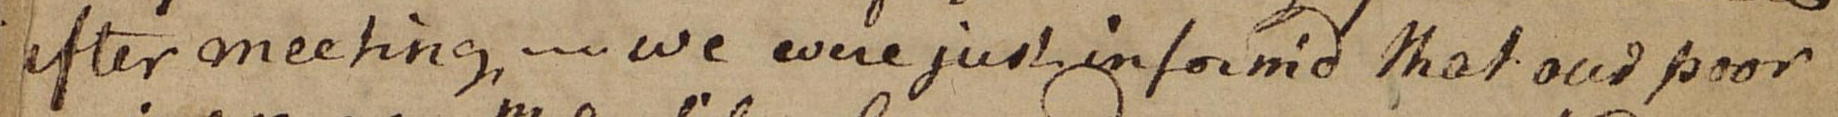after meeting, - we were just inform'd that our poor
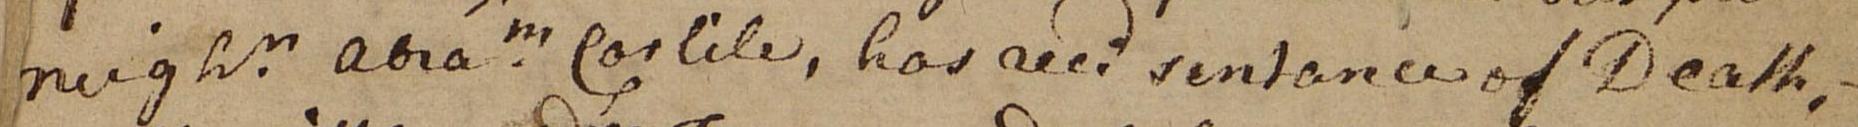Neigh^r. Abra ^m. Carlile, has rec^d. sentance of Death,-
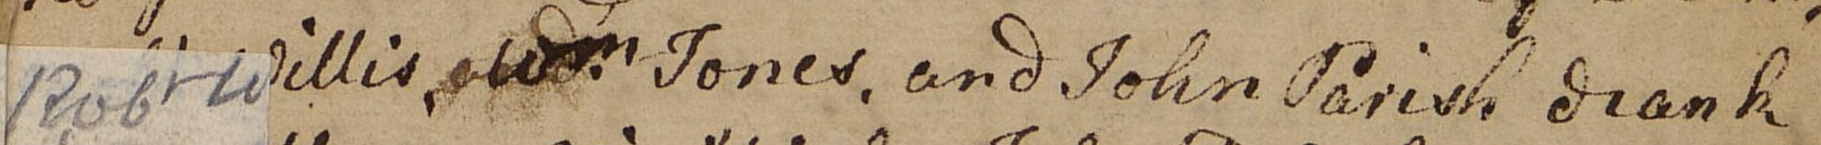Rob^t Willis, W^m. Jones, and John Parish drank
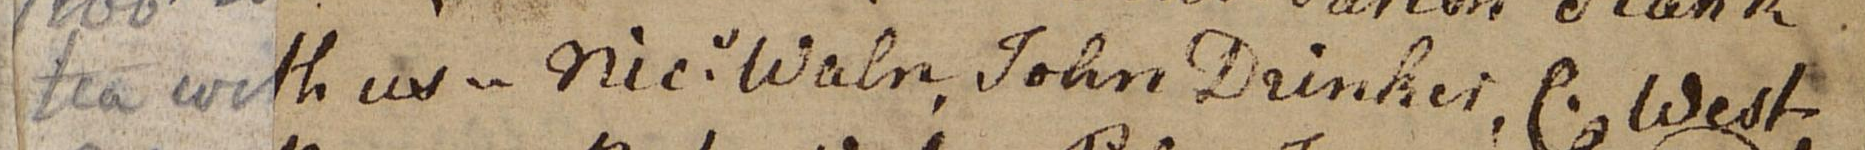tea with us- Nic^s. Waln, John Drinker, C. West,
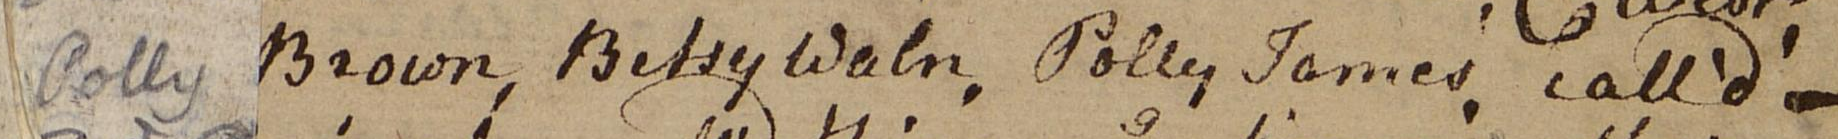Polly Brown, Betsy Waln, Polly James, call'd-
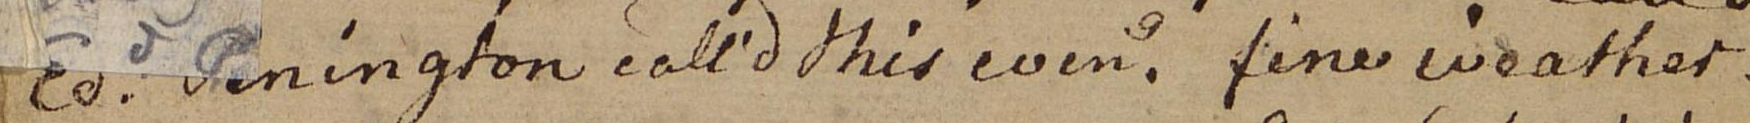Ed^d. Penington call'd this even^g. fine weather -
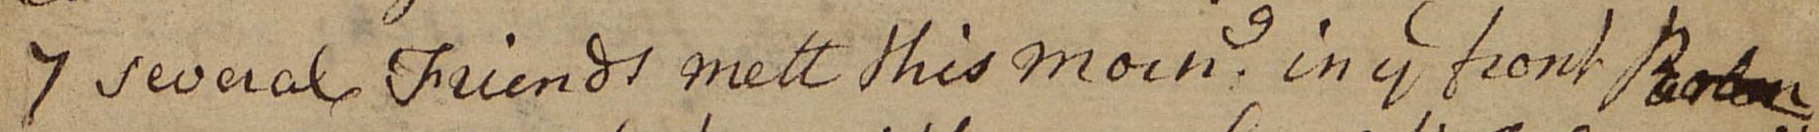7 several Friends mett this morn^g. in y^e front Parlor
